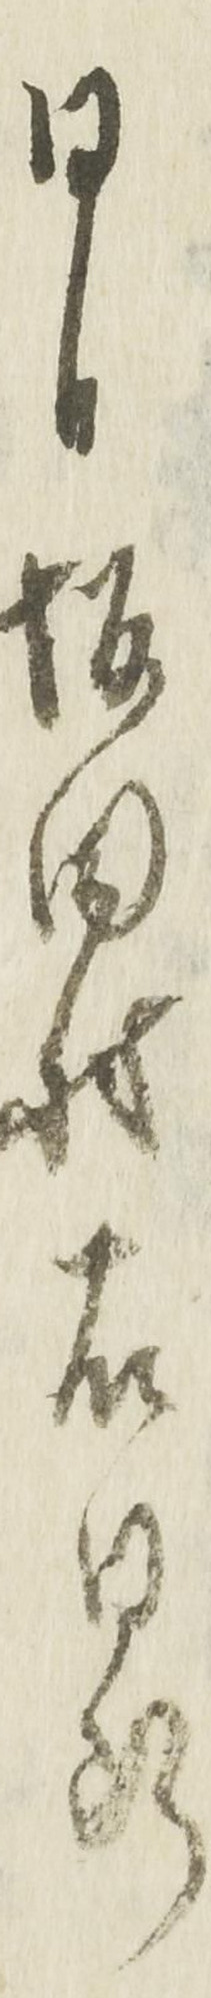同日坂田村右同断
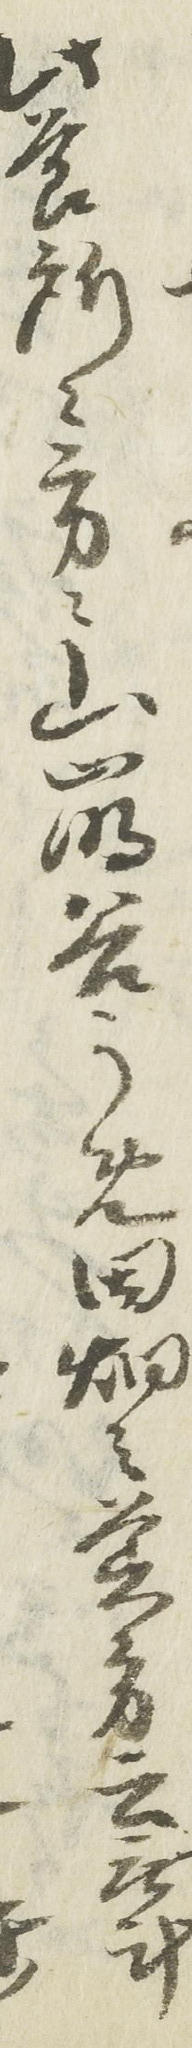此節所〻方〻山崩谷うめ田畑の荒方云無計
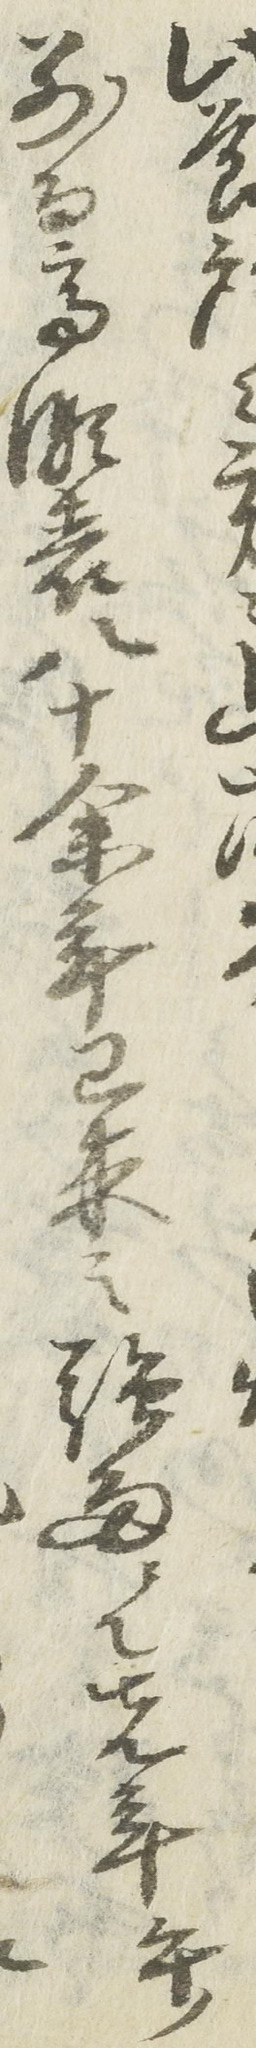別而高瀬表八十余年已来之強雨ニて先年午ノ
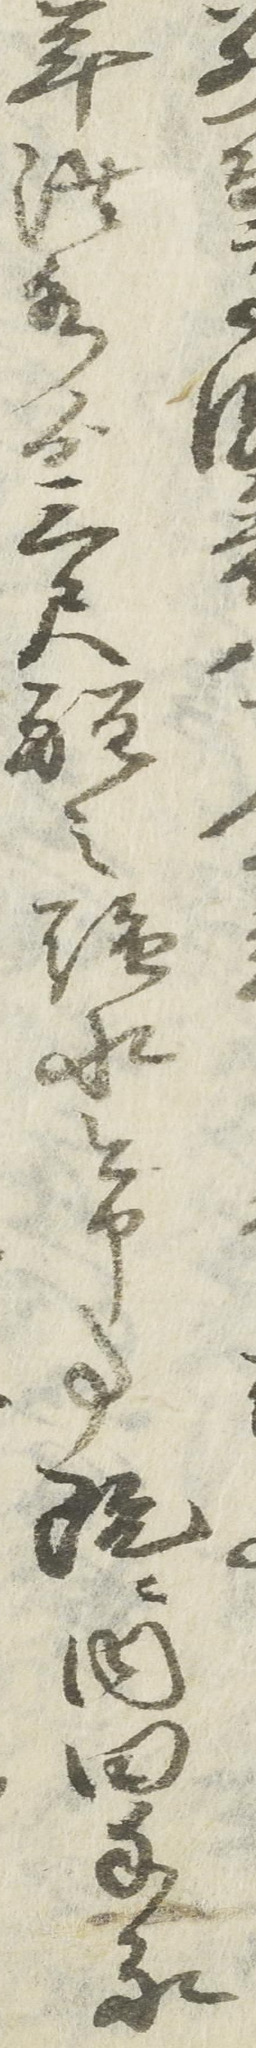年洪水ゟ三尺程之強水と申事既ニ内田手永
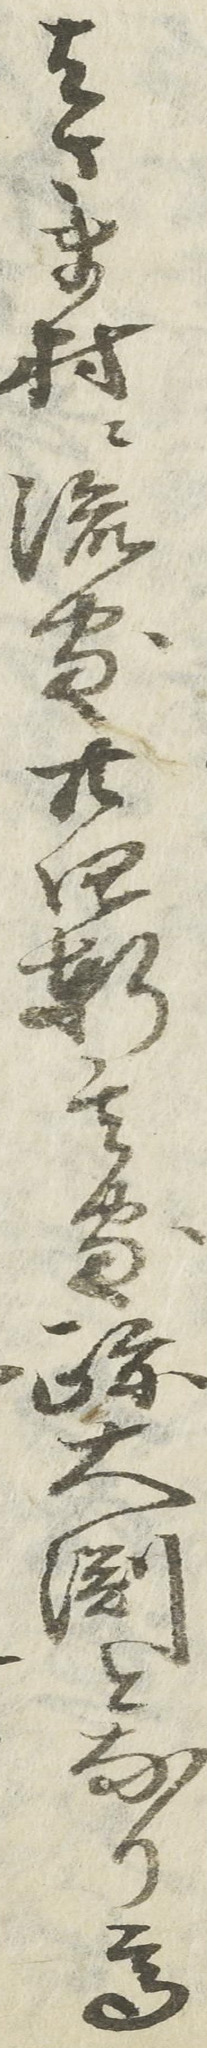はさま村ニ流家廿四軒其処跡大渕となり高
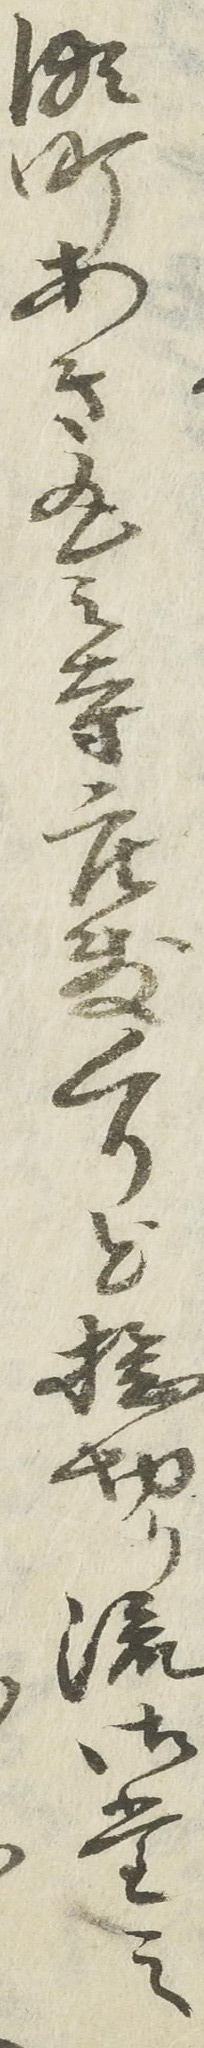瀬町あき丸之寺庄敷くりを捻切り流御堂之
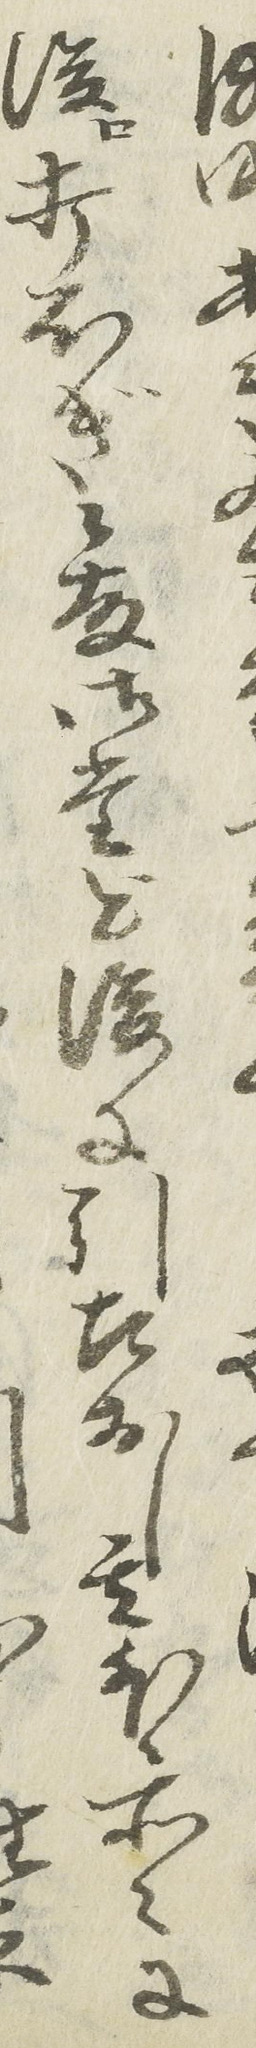後江打ほぎ候故御堂を後に引たおし其外所〻に
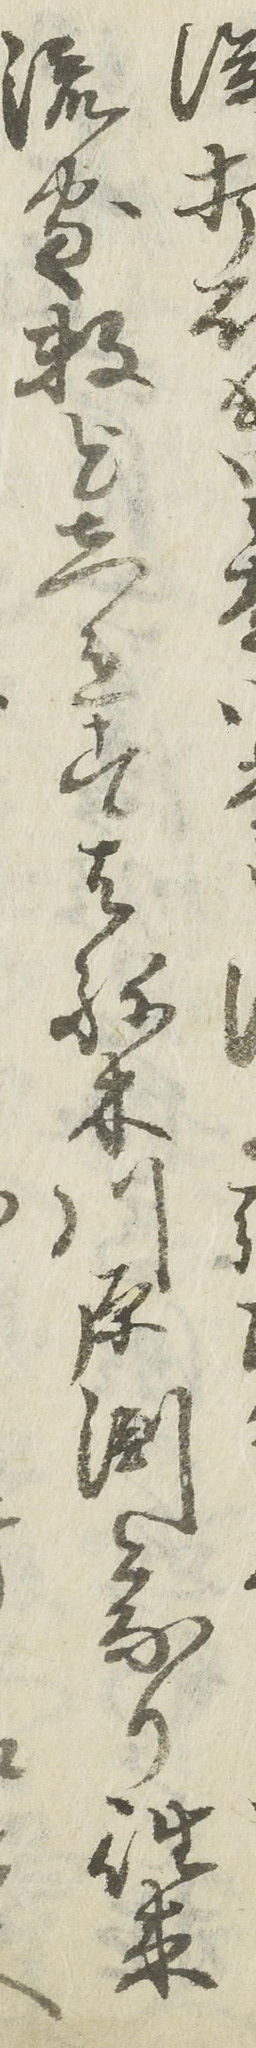流家数をしれすは弥木川原渕となり往来
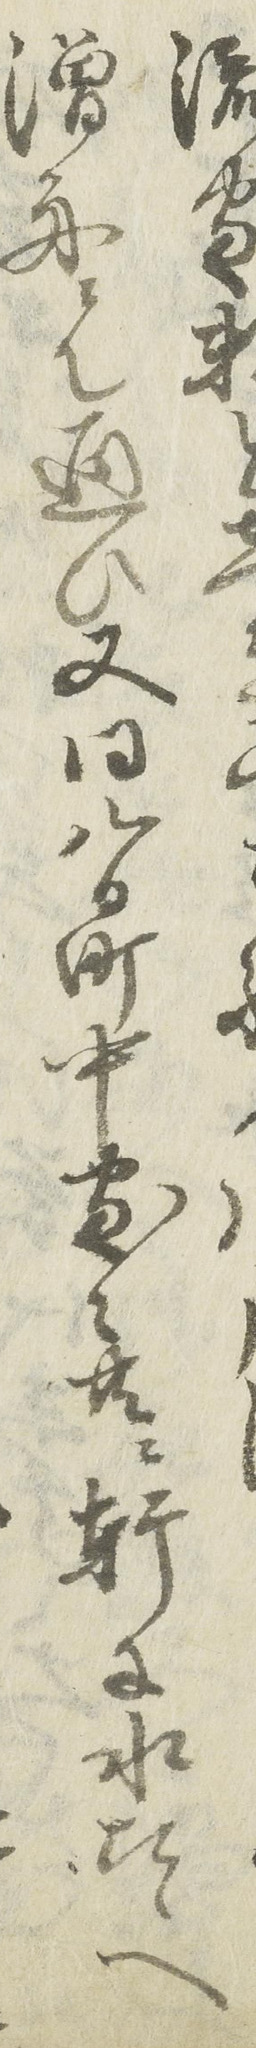漕舟にて通ひ又同八日町中家〻共ニ軒に水たゝへ
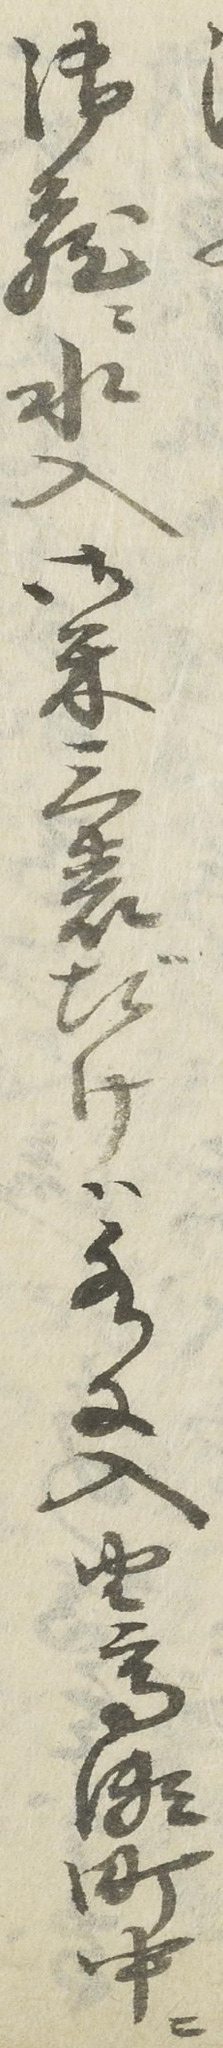御蔵ニ水入御米三表だけは水に入由高瀬町中ニ
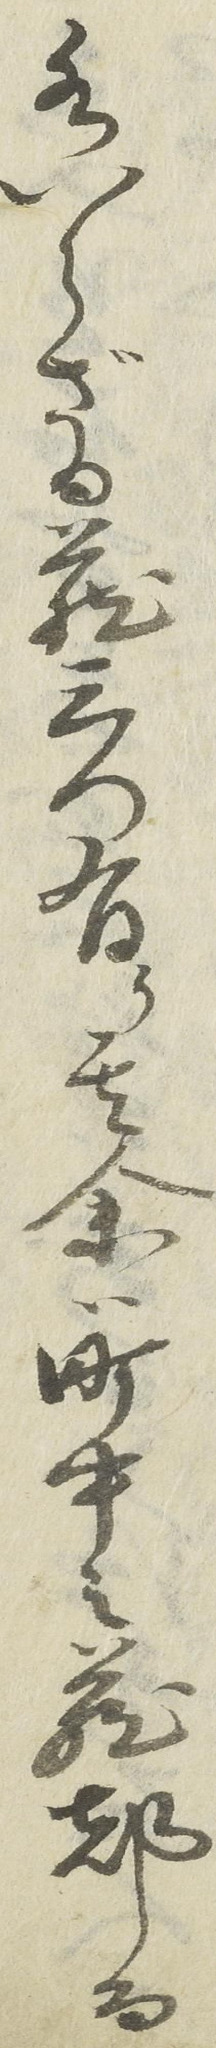水いらざる蔵三つ有り其余は町中之蔵都而

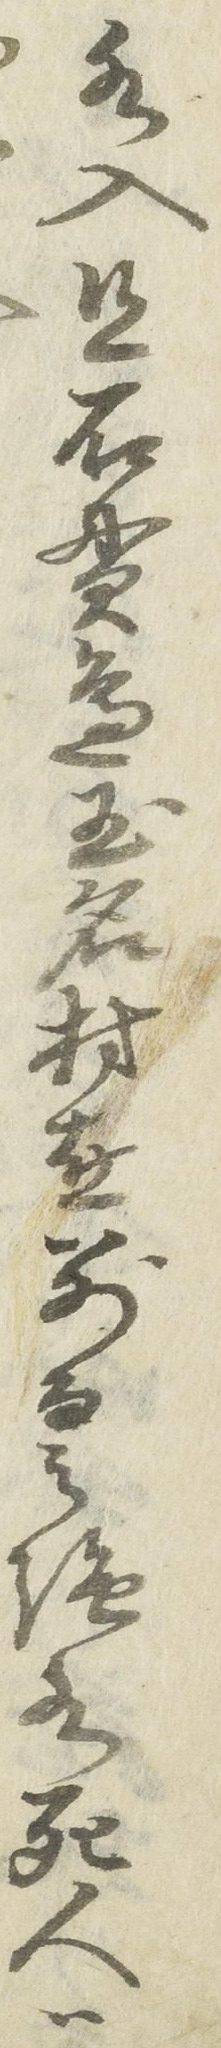水入且石貫辺玉名村在別而之強水死人は
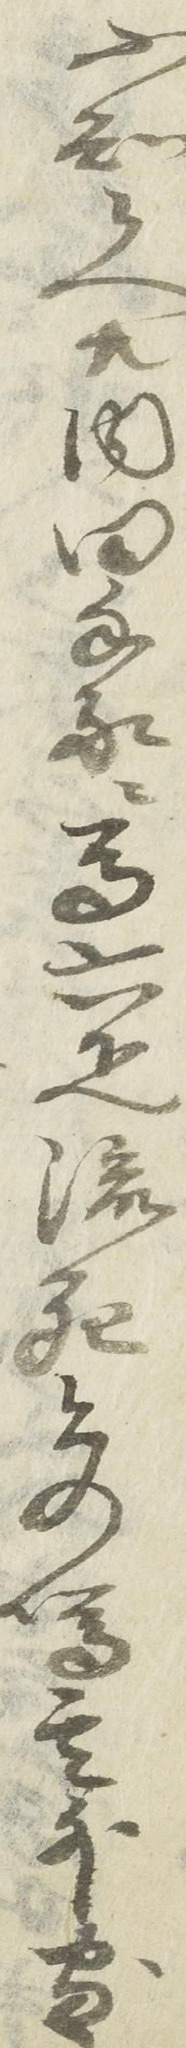不知候へ共内田手永ニ馬六疋流死との噂其外家
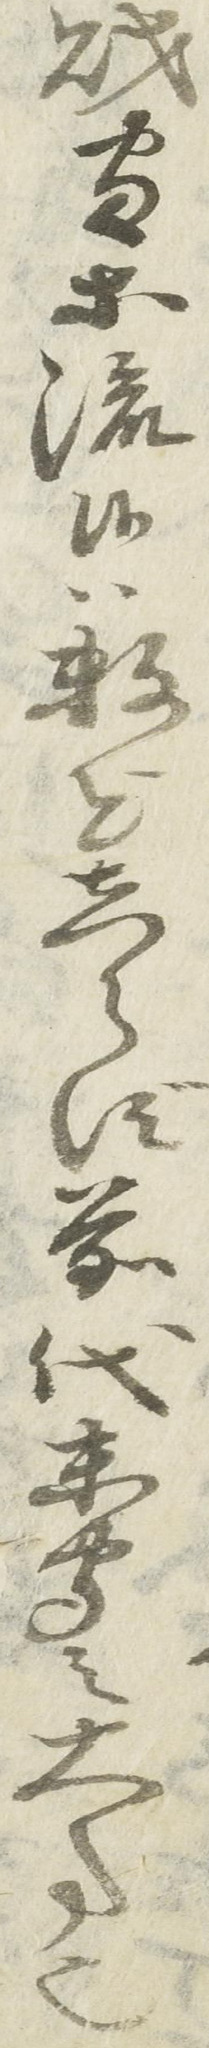財家等流候は数をしらず前代未聞之大事也
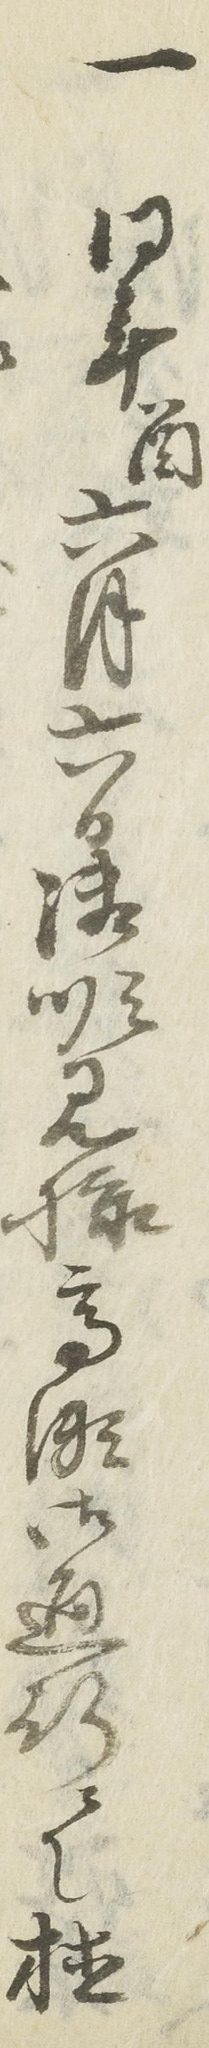一同年酉六月六日御順見様高瀬御通行ニて植
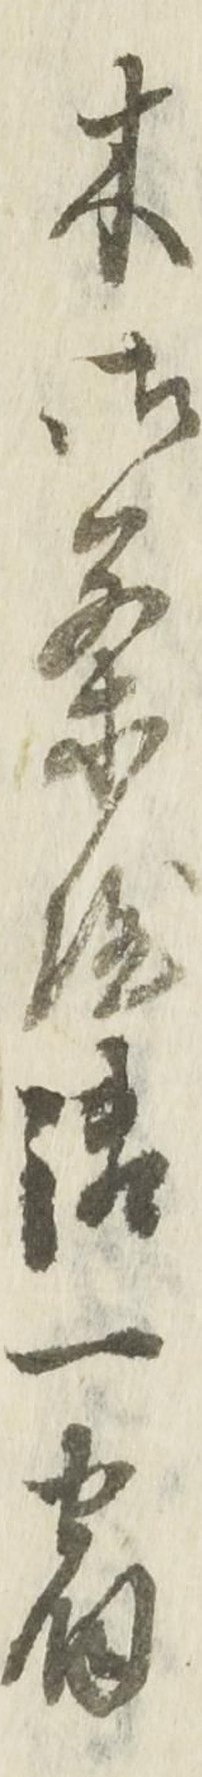木御茶屋御一宿
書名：後見笑
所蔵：東京大学地震研究所図書室 Earthquake Research Institute Library, The University of Tokyo, JAPAN
